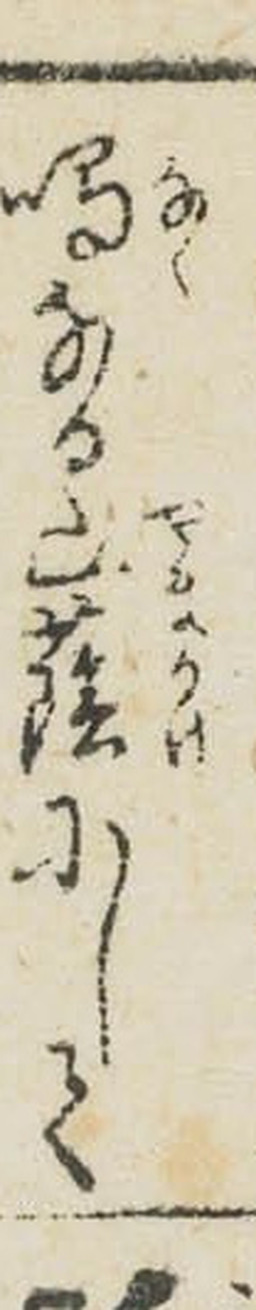鳴なる山蔭にして
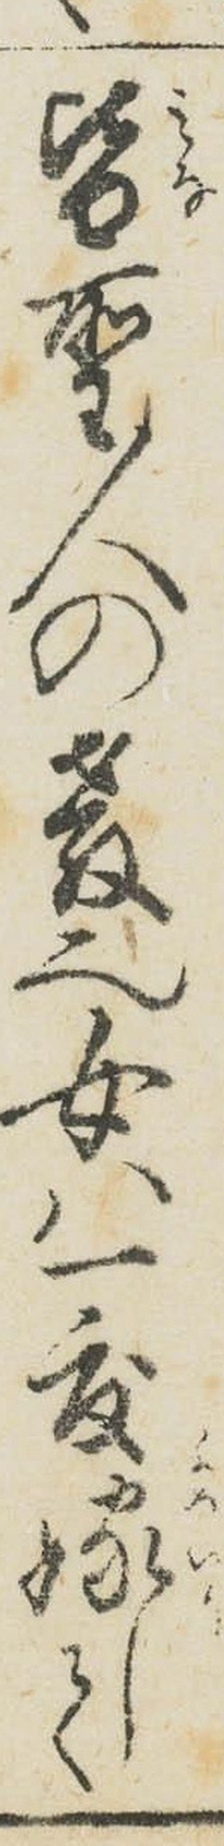皆聖人の教也女は一度嫁して
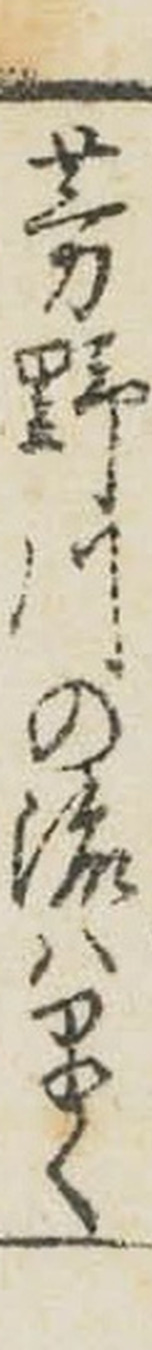芳野川の流は早く
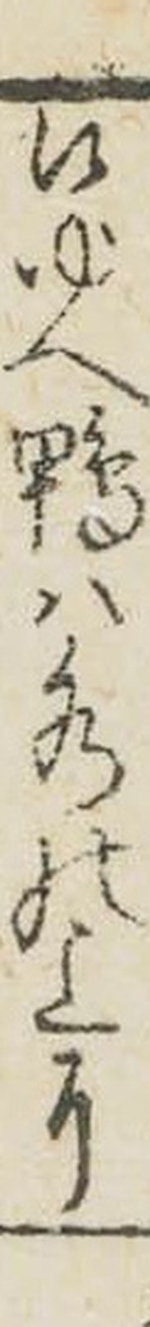候ゆへ鴨は水の上に
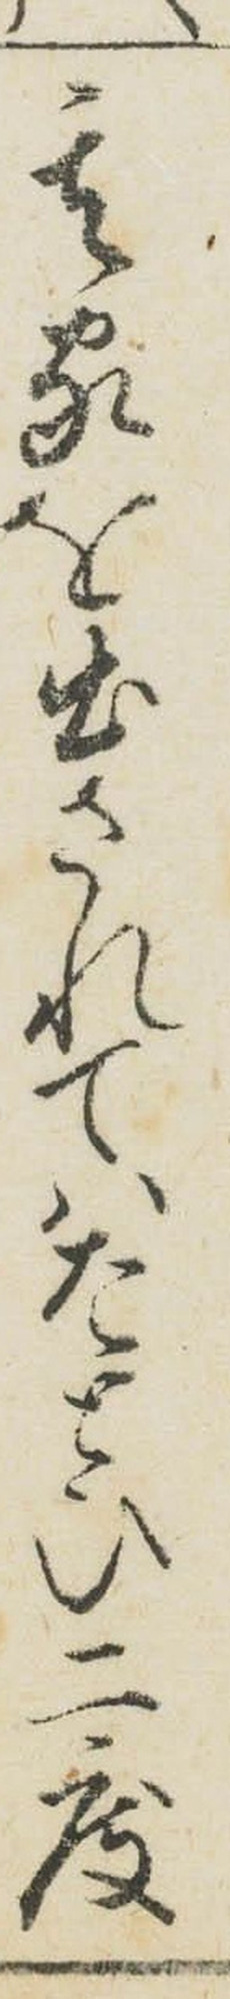其家を出されてはたとひ二度
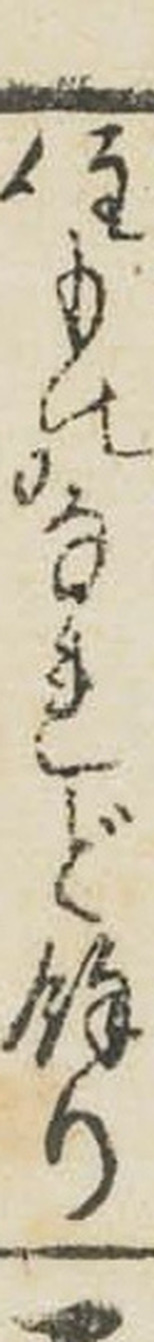住ものなれど余り
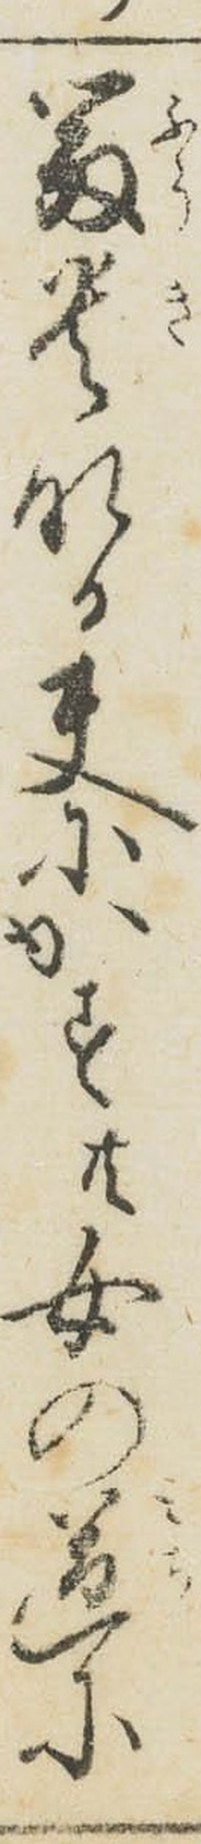富貴なる夫にかす共女の道に
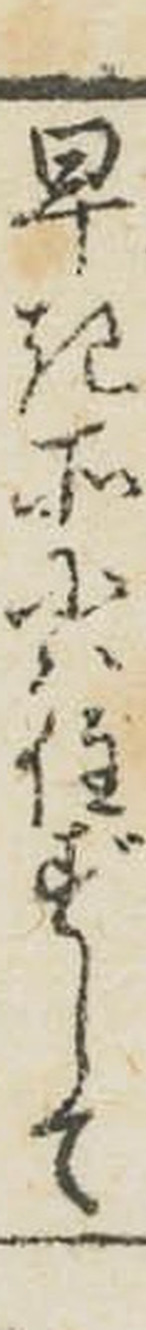早き所には住ずして
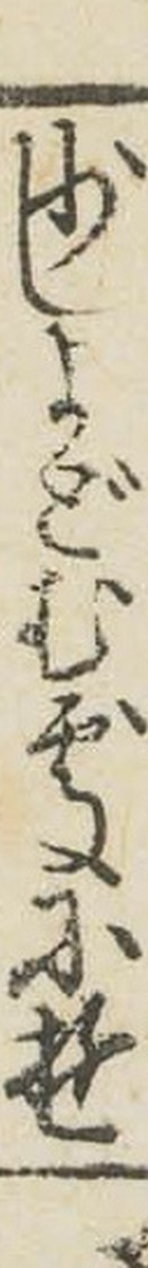少しよどむ處に遊
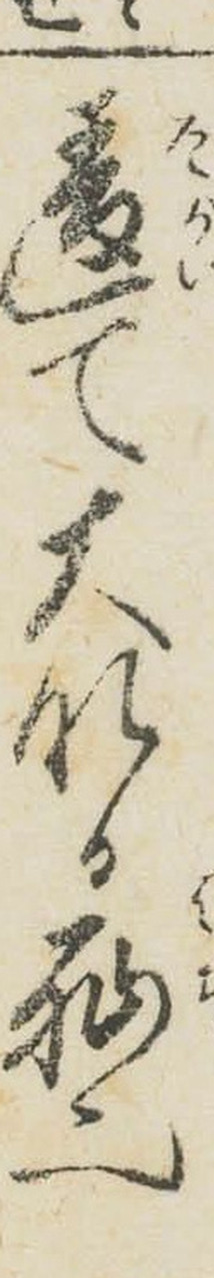違て大なる恥也
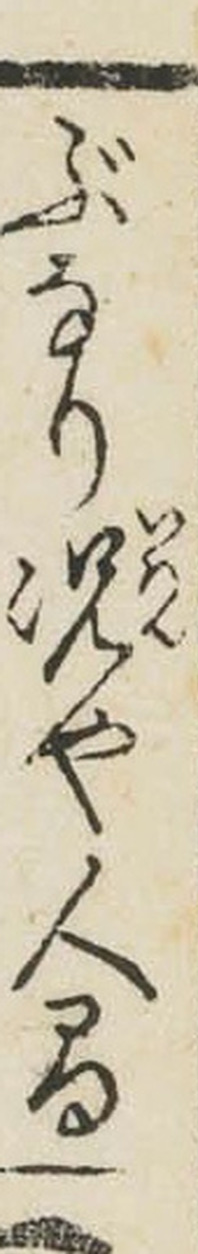ぶなり況や人間
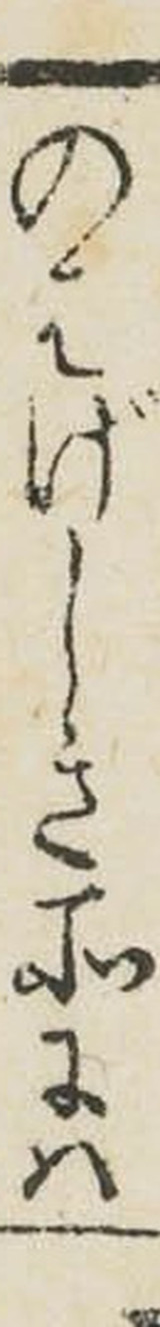のはげしき所には
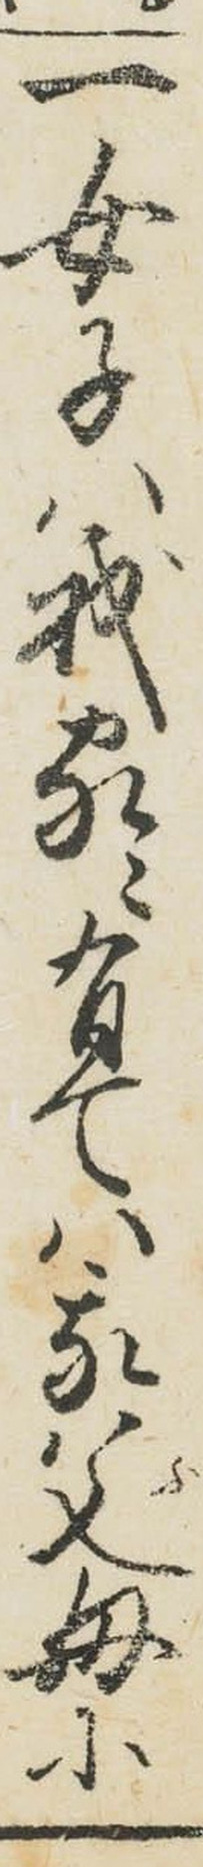一女子は我家有ては我父母に
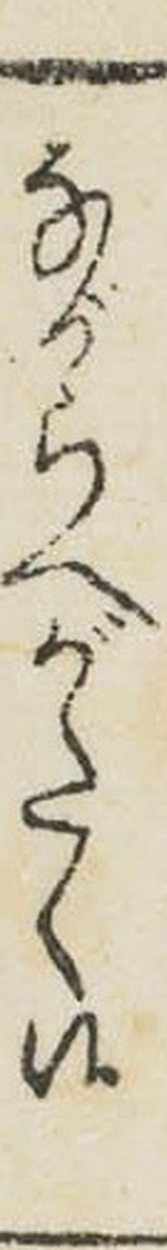ながらへがたく候
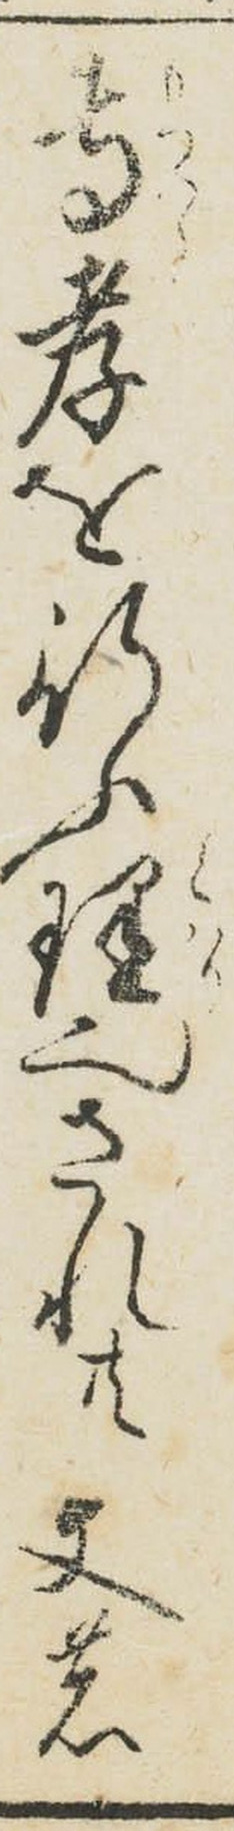専孝を行ふ理也され共夫の
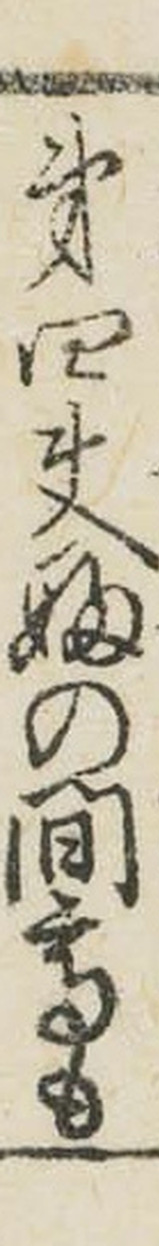第四夫婦の間高も
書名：女大学
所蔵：東京学芸大学教育コンテンツアーカイブ
